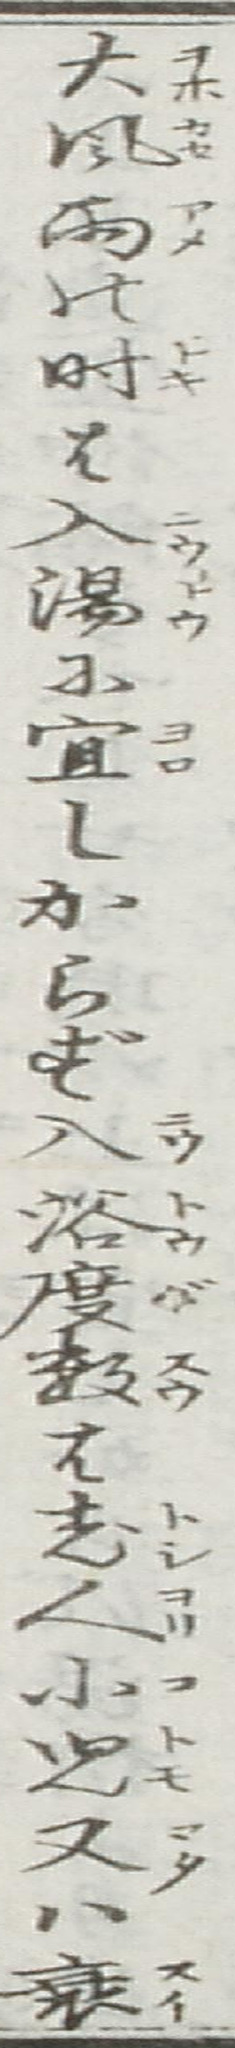大風雨の時は入湯に宜しからず入浴度数は老人小児又は衰
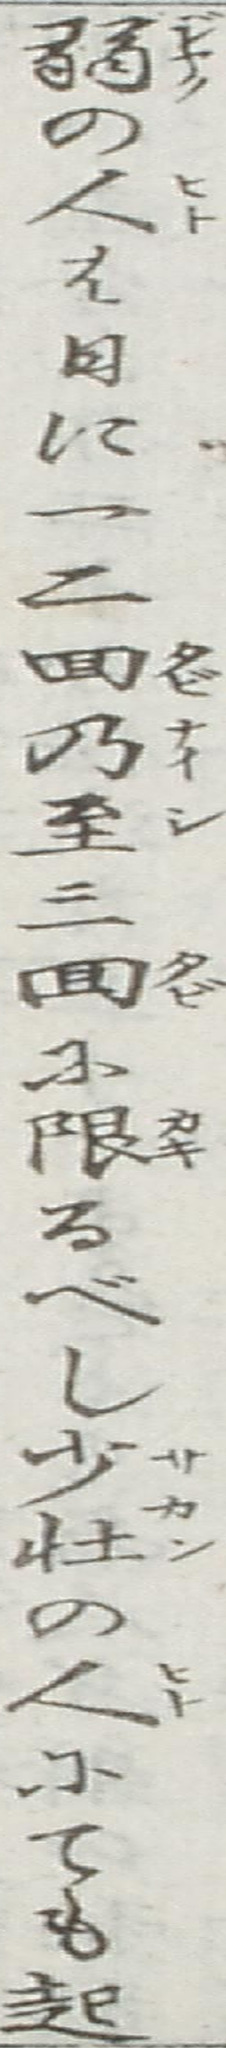弱の人は日に一二回乃至三回に限るべし少壮の人にても起
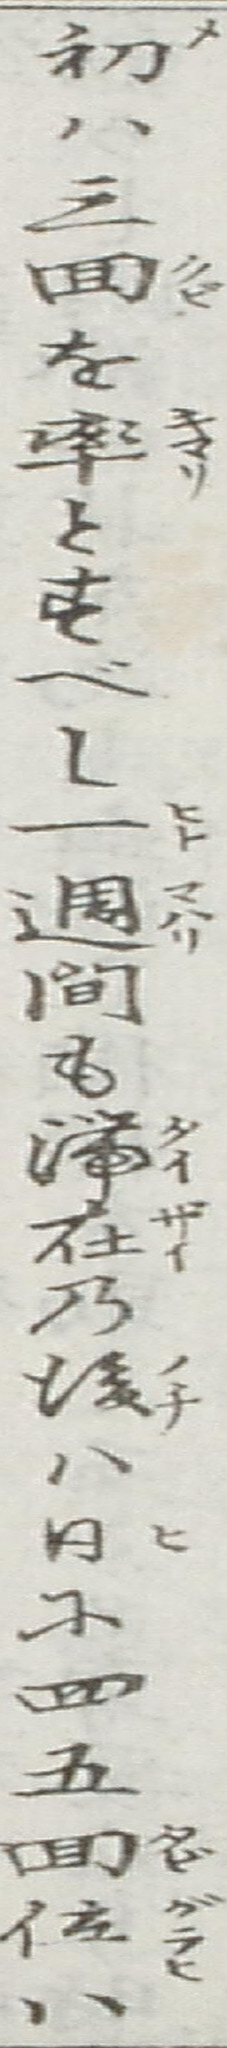初は三回を率とすべし一週間も滞在の後は日に四五回位は
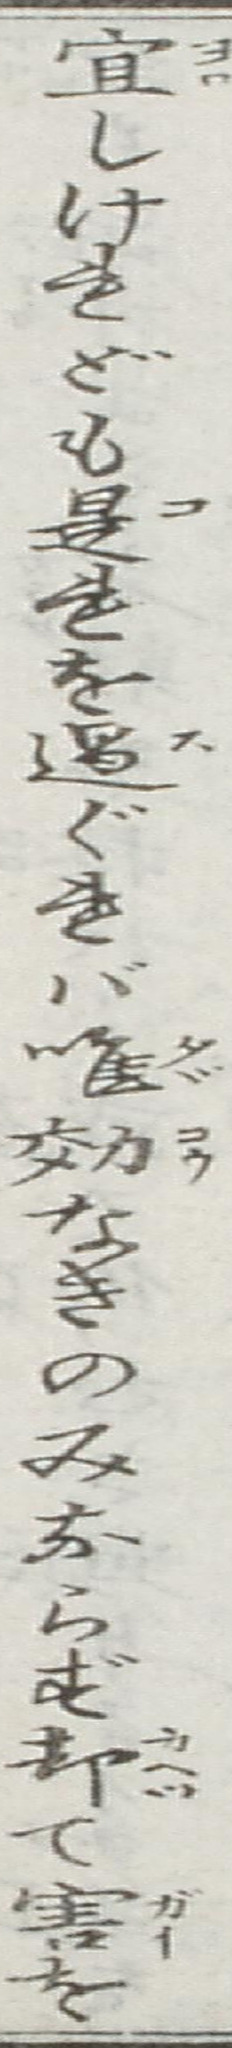宜しけれども是れを過ぐれば唯効なきのみならず却て害を
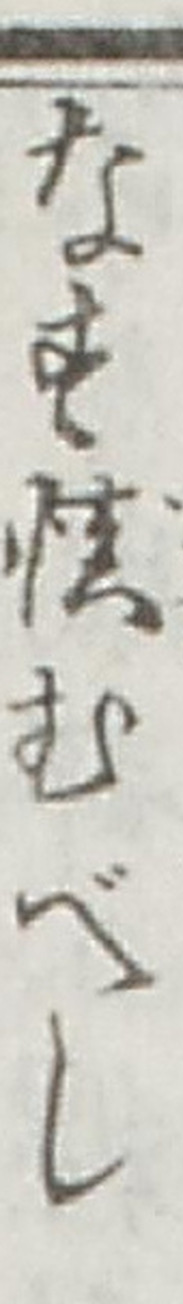なす怯むべし
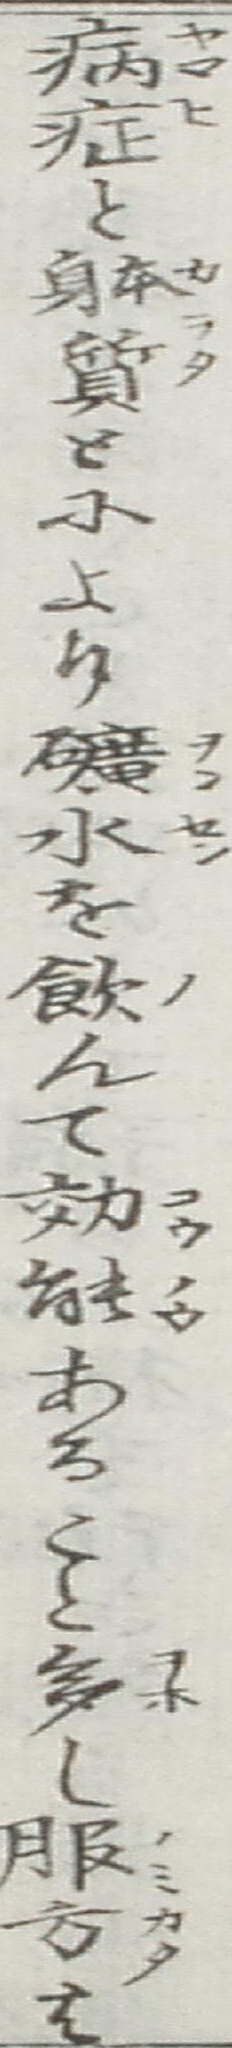病症と体質とにより鉱水を飲んて効能あること多し服方は
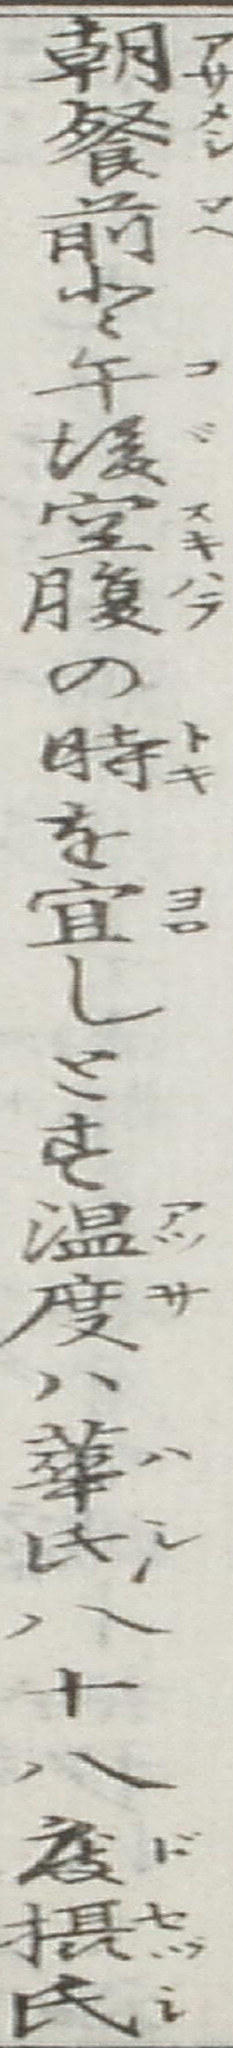朝餐前と午後空腹の時を宜しとす温度は華氏八十八度摂氏
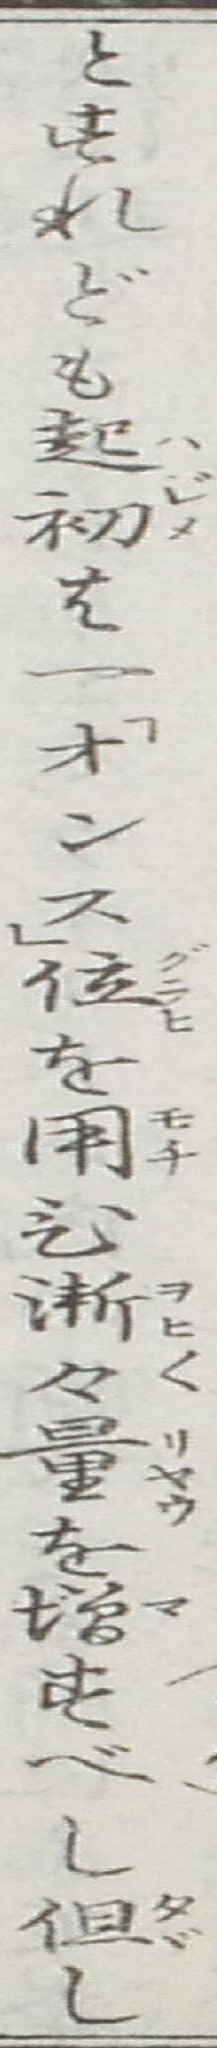とすれども起初は一「オンス」位を用ひ漸々量を増すべし但し
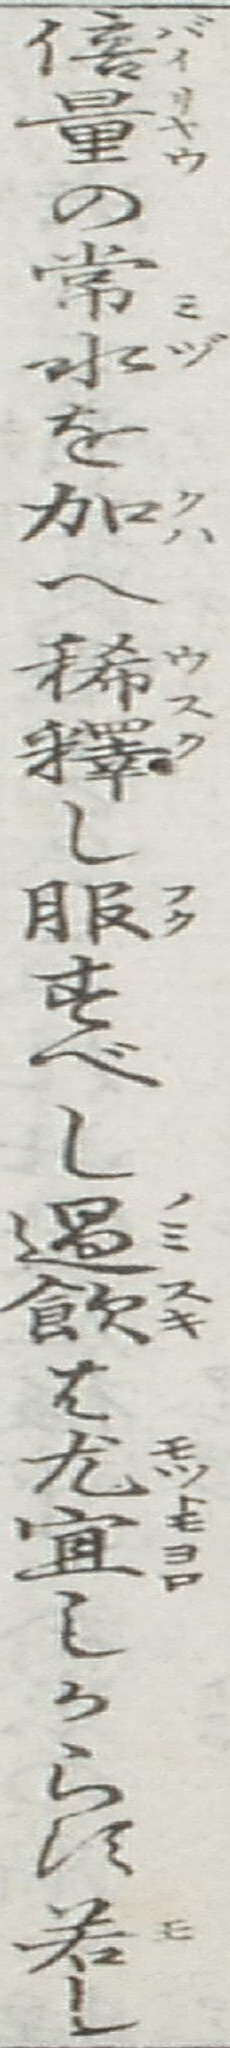倍量の常水を加へ希釈し服すべし過飲は尤宜しからす若し
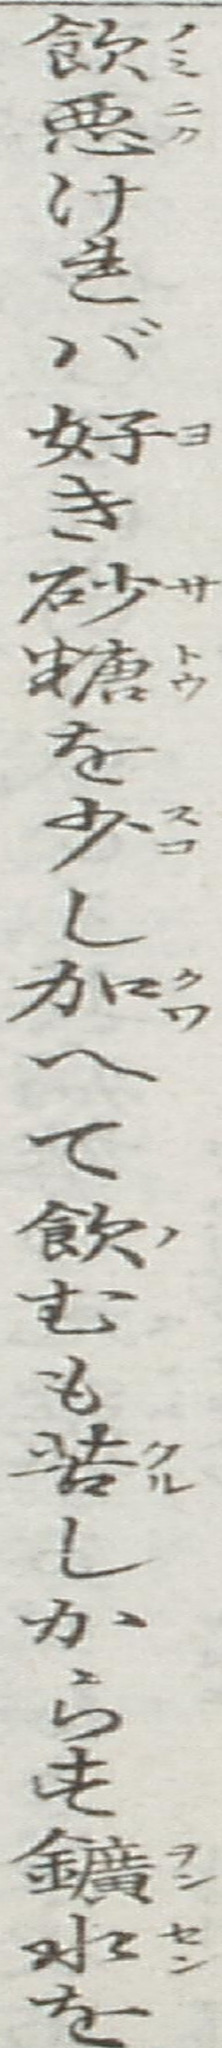飲悪ければ好き砂糖を少し加へて飲むも苦しからす鉱水を
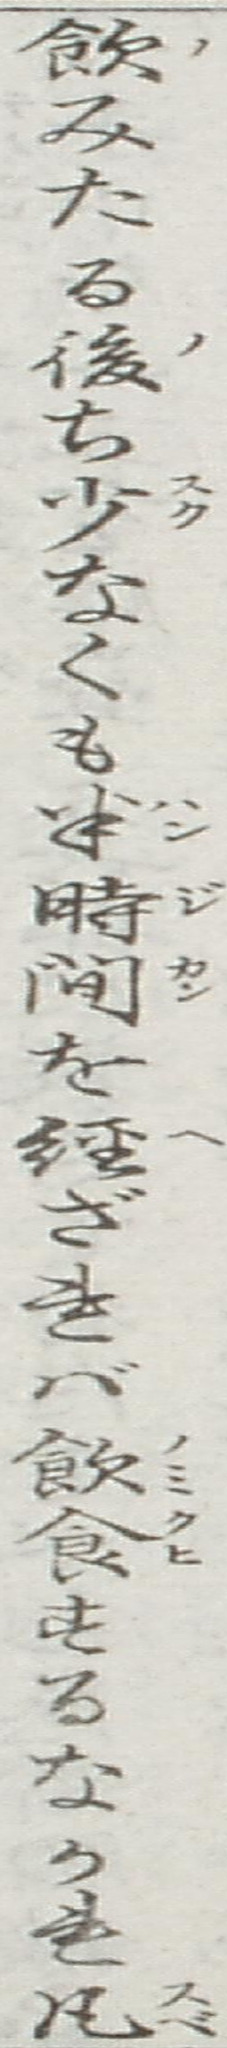飲みたる後少なくも半時間を経ざれば飲食するなかれ凡
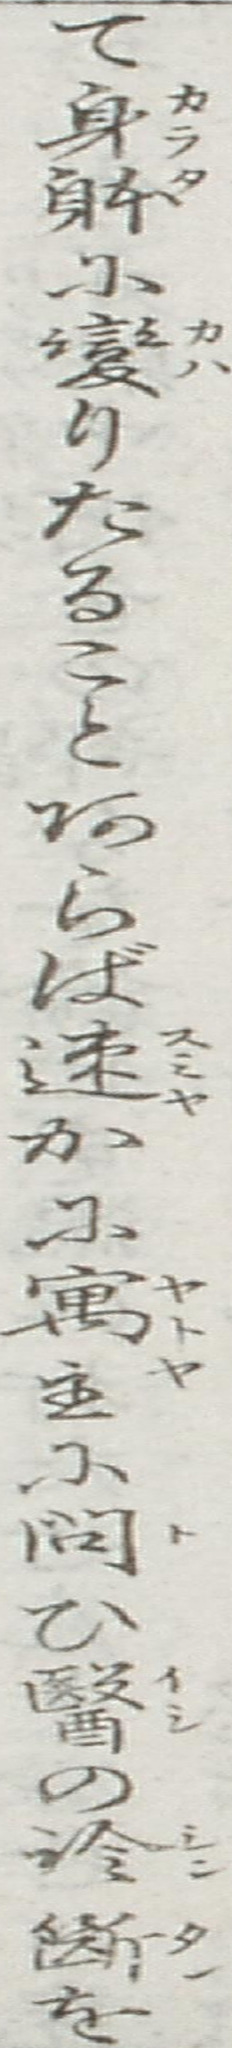て身体に変りたることあらば速かに寓主に問ひ医の診断を
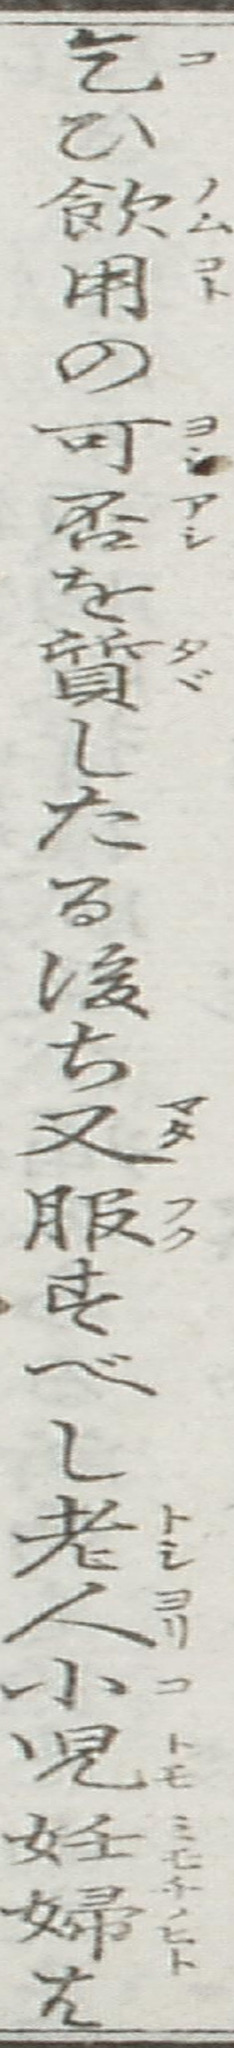乞ひ飲用の可否を質したる後ち又服すべし老人小児妊婦は
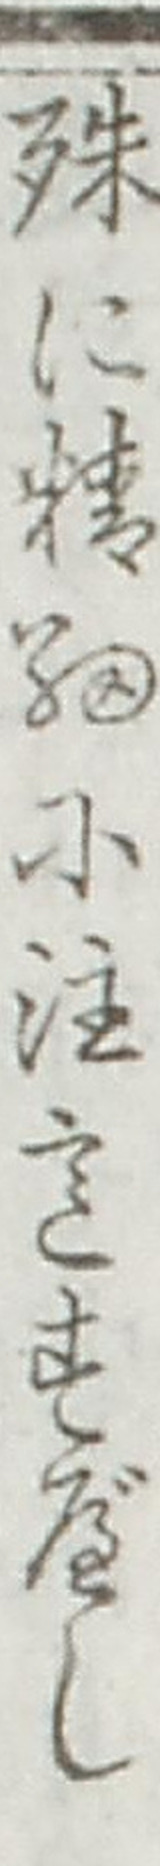殊に精細に注意すべし
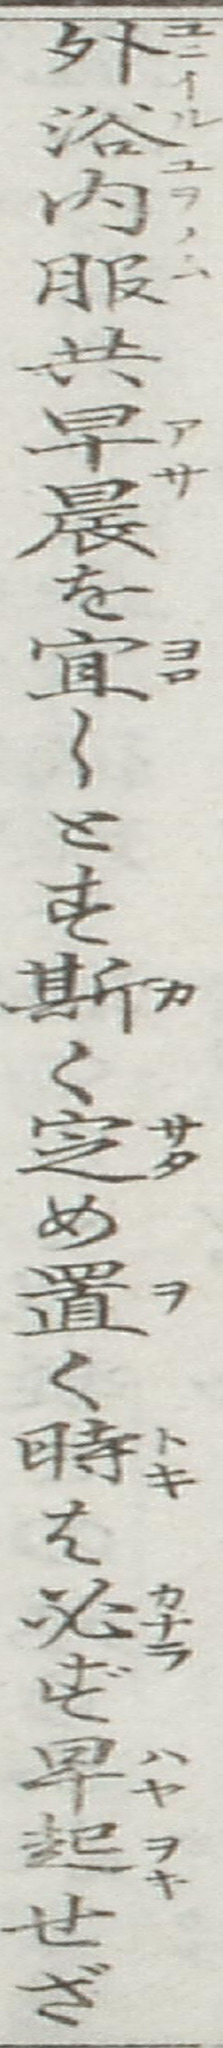外浴内服共早晨を宜しとす斯く定め置く時は必ず早起せざ
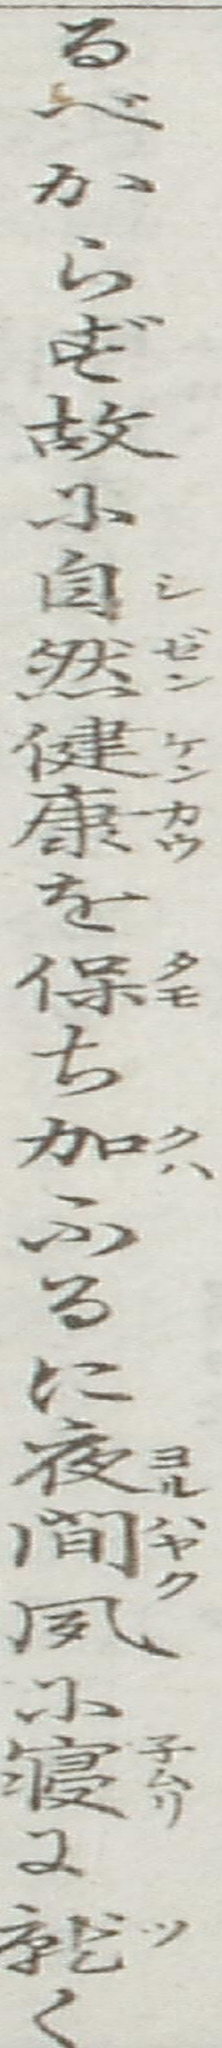るべからず故に自然健康を保ち加ふるに夜間夙に寝に就く
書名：草津温泉誌　全
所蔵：東京大学地震研究所図書室 Earthquake Research Institute Library, The University of Tokyo, JAPAN
